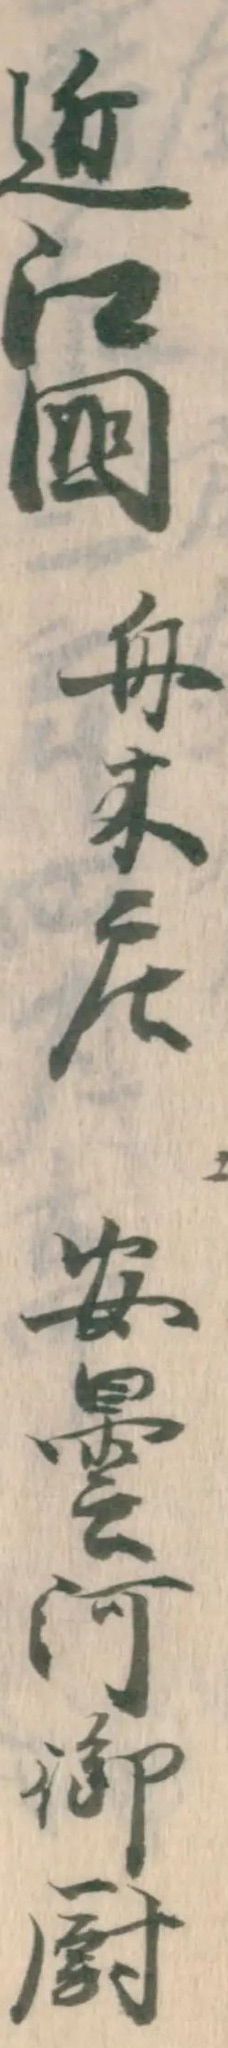近江国舟木庄安曇河御厨
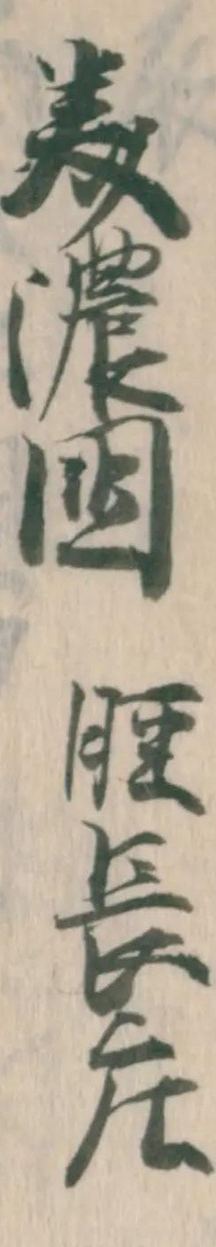美濃国脛長庄
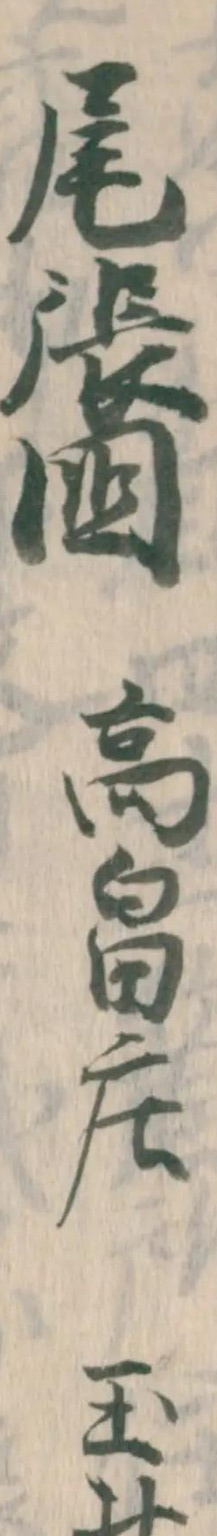尾張国高畠庄玉井庄
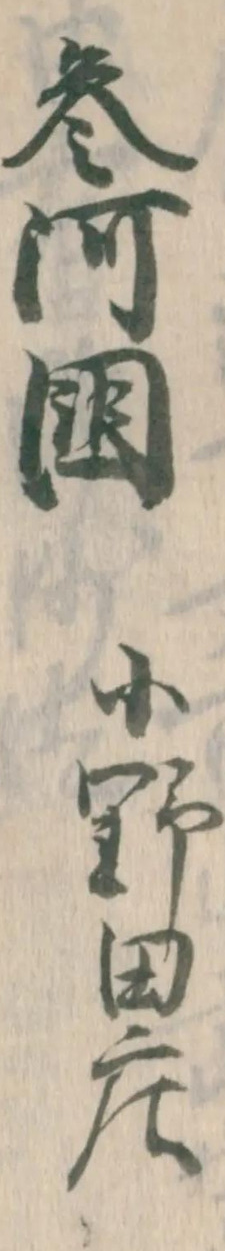参河国小野田庄

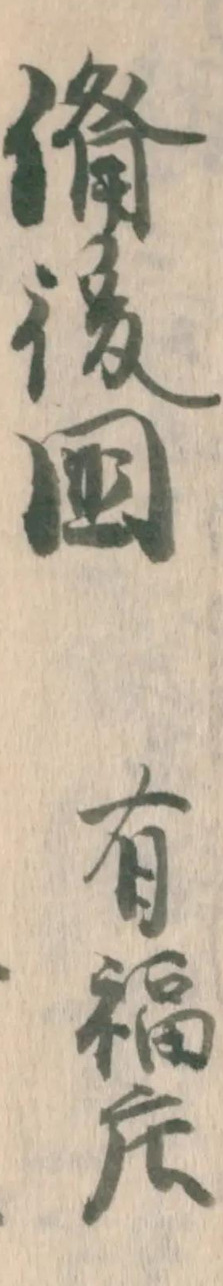備後国有福庄
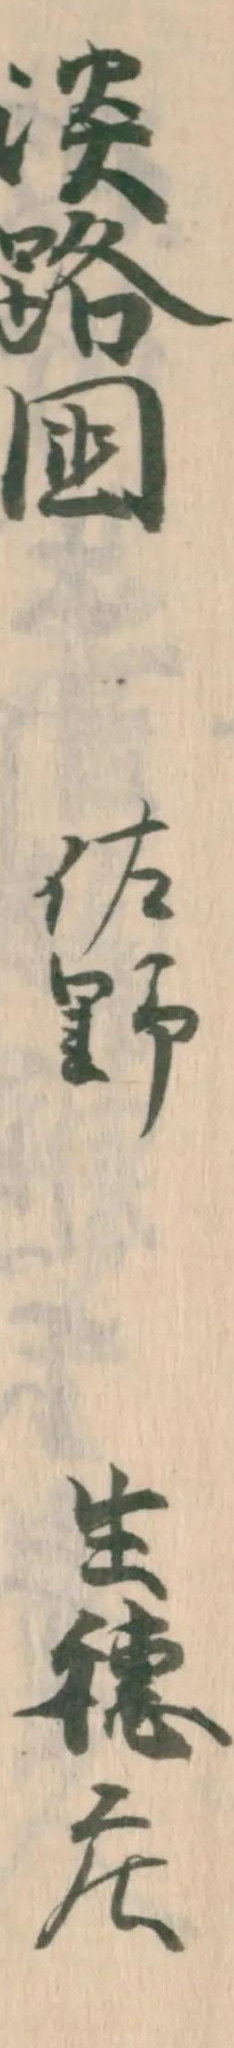淡路国佐野生穂庄
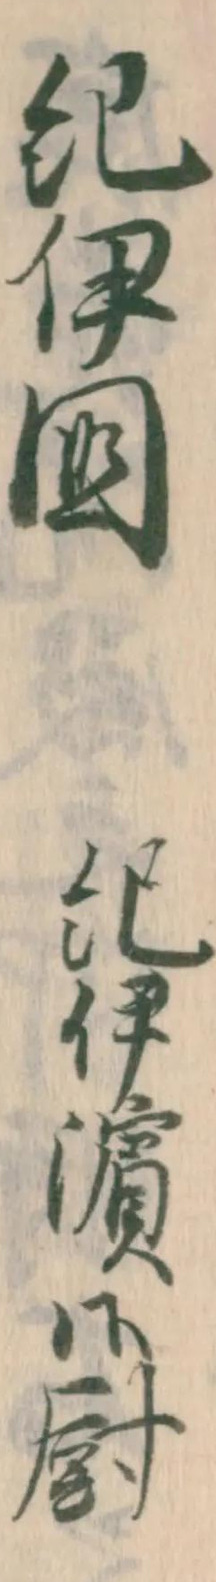紀伊国紀伊浜御厨
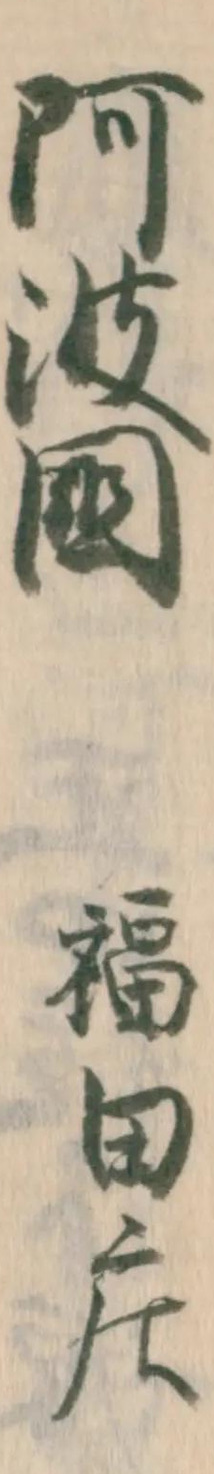阿波国福田庄
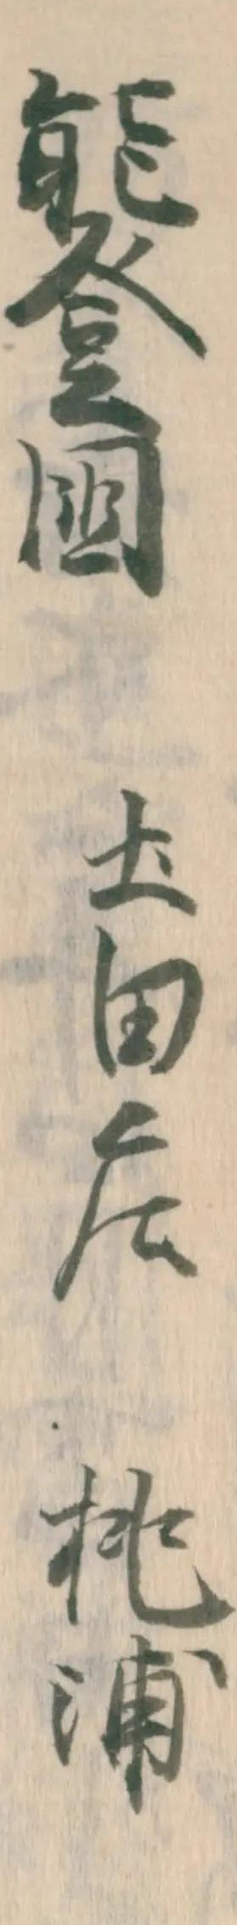能登国土田庄桃浦
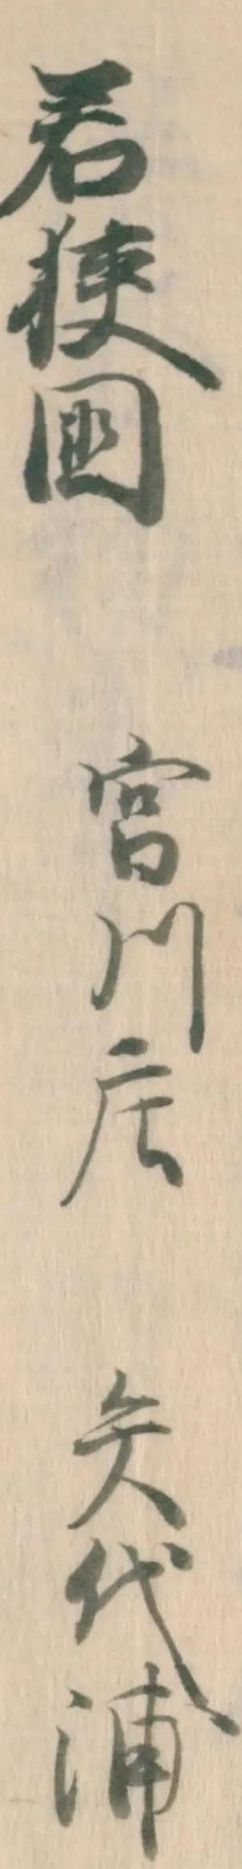若狭国宮川庄矢代浦
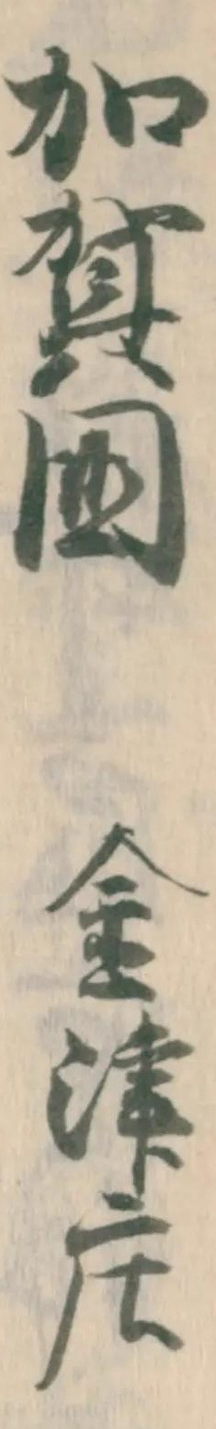加賀国金津庄
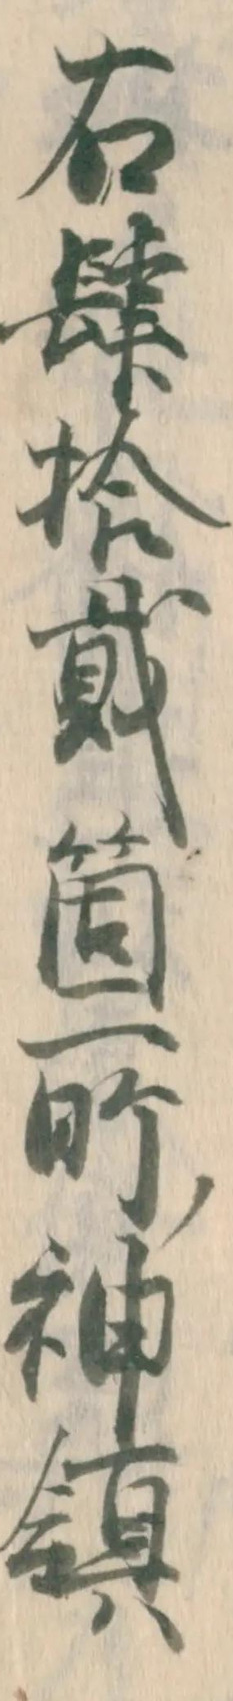右肆拾弐箇所神領

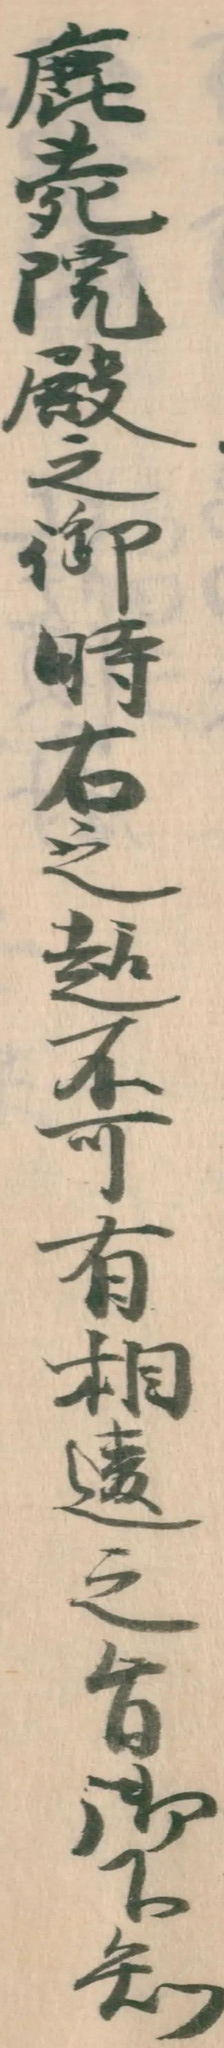鹿苑院殿之御時右之趣不可有相違之旨御下知
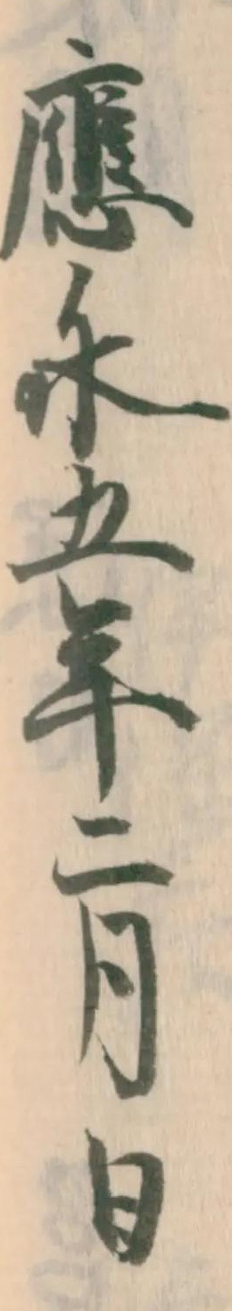應永五年二月日
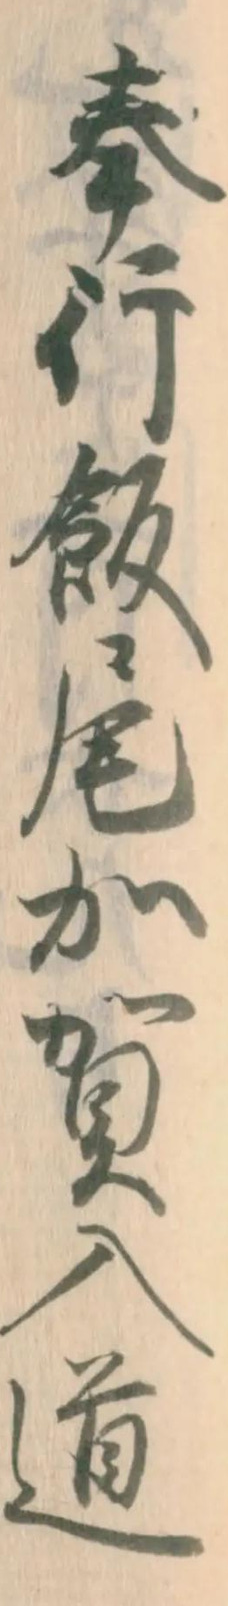奉行飯尾加賀入道
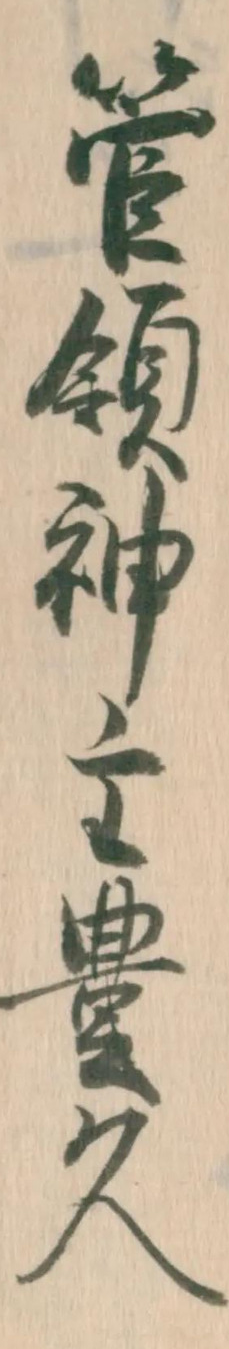管領神主豊久
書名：賀茂社記録. 第1冊
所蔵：国立国会図書館 National Diet Library, JAPAN
